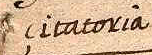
citatoria
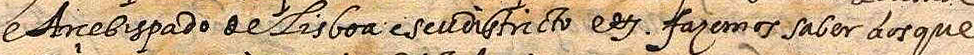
e Arcebispado de Lisboa e seu distritcto etc. fazemos saber aos que
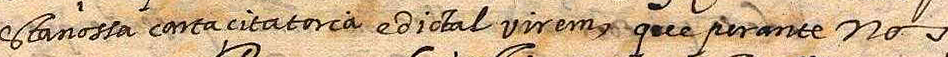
esta nossa carta citatoria edictal uirem, que perante nos
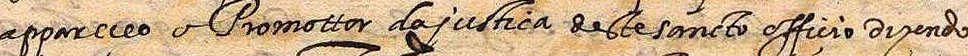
appareceo o Promottor da justiça deste sancto officio dizendo
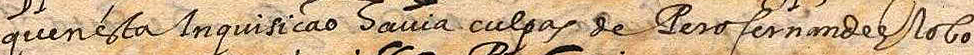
que nesta Inquisição hauia culpas de Pero fernandez lobo
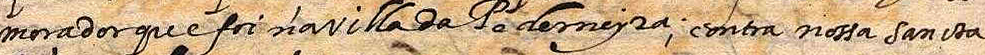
morador que foi na villa da Pederneyra, contra nossa sancta
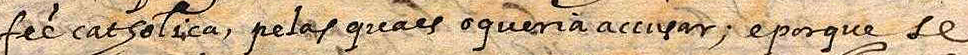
feé catholica, pelas quaes o queria accusar; e porque se
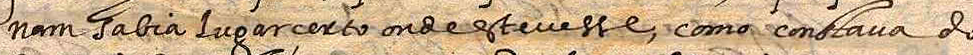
nam sabia lugar certo onde esteuesse, como constaua do
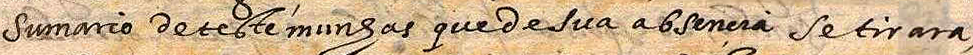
Sumario de testemunhas que de sua absencia se tirara,
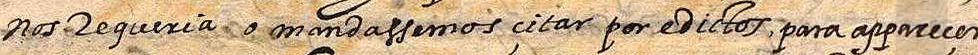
nos Requeria o mandassemos citar por edictos, para apparecer
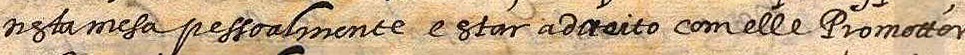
nesta mesa pessoalmente e estar a direito com elle Promottor
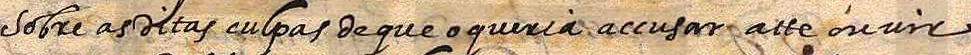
sobre as ditas culpas de que o queria accusar atte ouuir
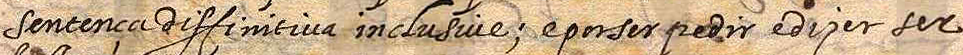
sentença diffinitiua inclusiue; e por ser pedir e dizer ser
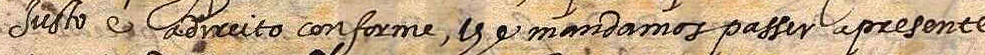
Justo e a direito conforme, lhe mandamos passar a presente
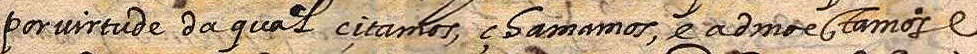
por uirtude da qual citamos, chamamos, e admoestamos e
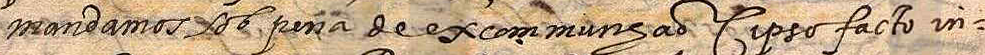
mandamos sob pena de excommunhaõ E ipso facto in
